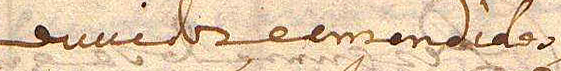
ouuidos e entendidos
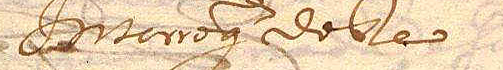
Interrog.os do Reo
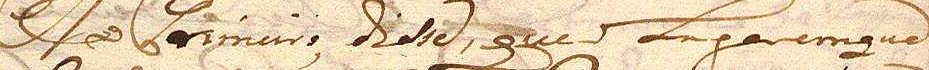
Ao Primeiro, disse, que o Lugar em que
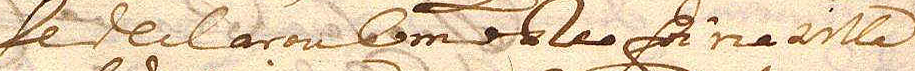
se declarou Como Reo foi na villa
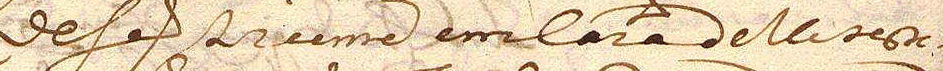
de saõ vicente em Caza delle teste
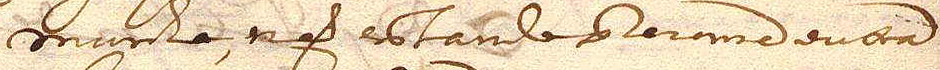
munha, naõ estando prezente outra
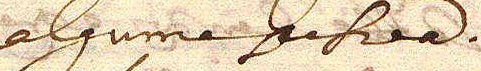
alguma pessoa.
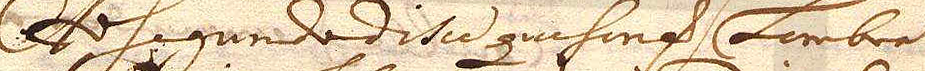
Ao segundo disse que se naõ Lembra
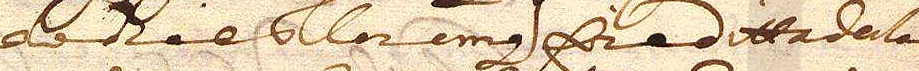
do dia e Mez em q̄ fez a ditta decla
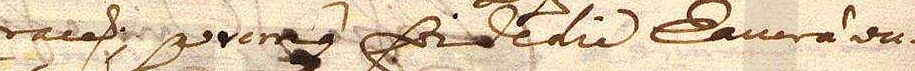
raçaõ; porem q̄ foi de dia haverá ou
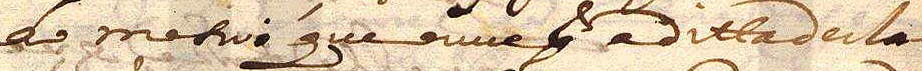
do motivo que ouue p̄ a ditta decla
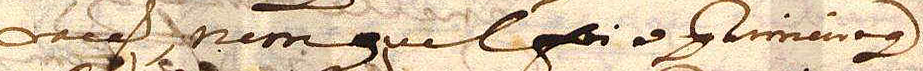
raçaõ, nem qual foi o primeiro q̄
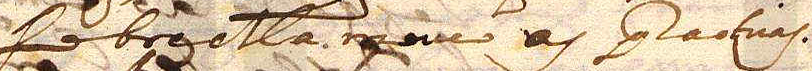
sobre ella moueo as practicas.
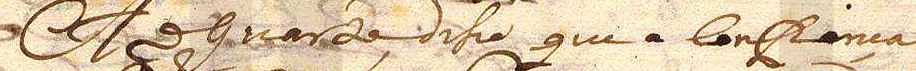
Ao quarto, disse que a Confiança
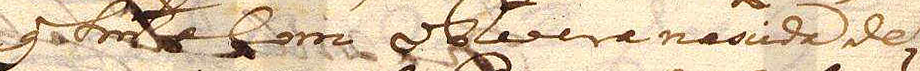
q̄ tinha Com o Reo era nascida de
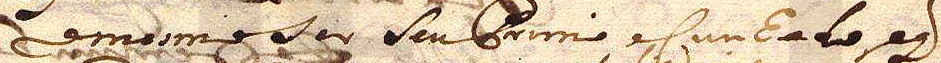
o mesmo ser seu Primo, e Cunhado, e q̄
